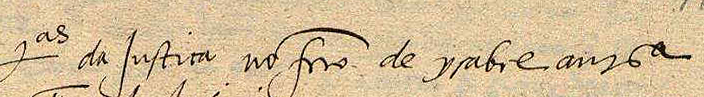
tas da Justiça no fc̄co de ysabel anta
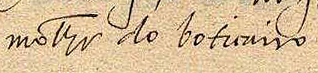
molher do boticairo
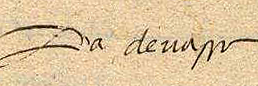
Da deuassa
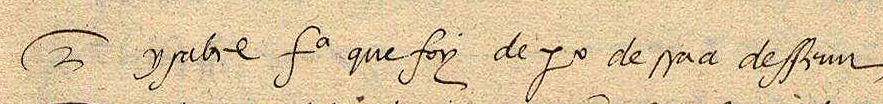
item ysabel fa que foy de ꝑo de ssaa de sseuer
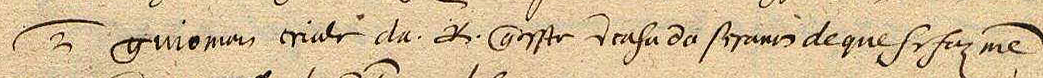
item guiomar criada da .R. q̄ esta ē casa da scraua de que se faz mē
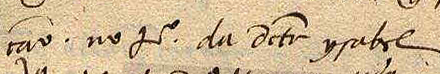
ção. no to. da dc̄ta ysabel
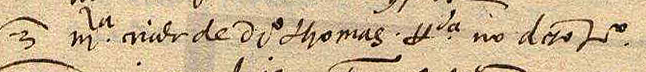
item mra criada de dio thomas .Rda. no dc̄to to.
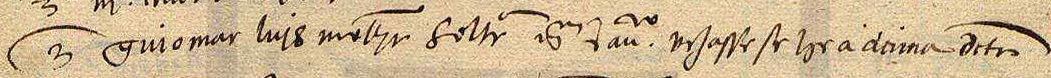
item guiomar luis molher soltra mra ē auro veJasse se he a acima dc̄ta
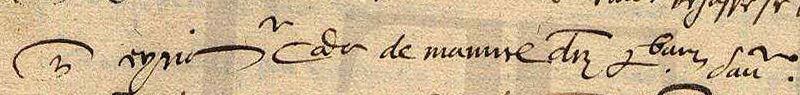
item eyria Crada de manuel d̄iz tbam dauro.
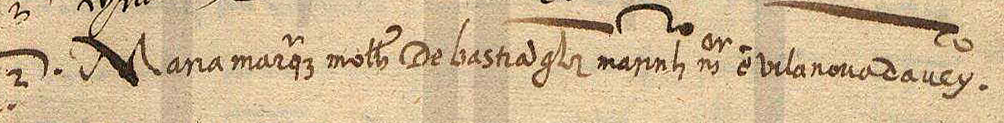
item. Maria marq̄z molh̄ de bastiā gl̄z marinhro mor ē vila noua daueyro.
